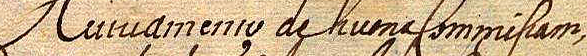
Autuamento de huma Commissam,
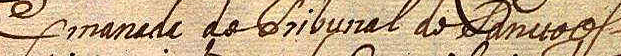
emanada do Tribunal do Sancto of
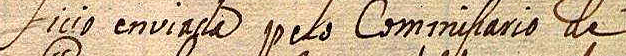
ficio enviada pelo Commissario de
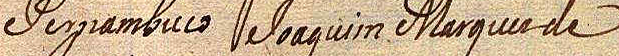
Pernambuco Ioaquim Marquez de
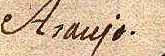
Araujo.
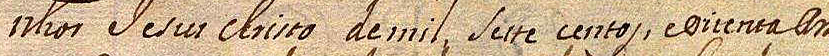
nhor Iesus christo de mil settecentos, e oitenta an
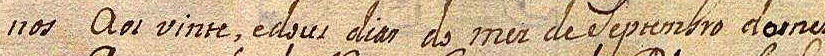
nos aos vinte, e dous dias do mez de Septembro do mez
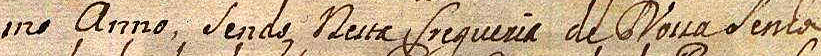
mo anno, sendo nesta freguezia de Nossa Senho
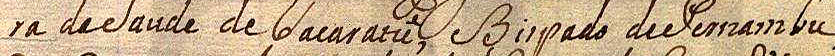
ra da Saude de Tacaratú, Bispado de Pernambu
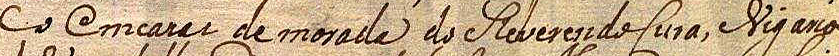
co em cazaz de morada do Reverendo Cura, e Vigario
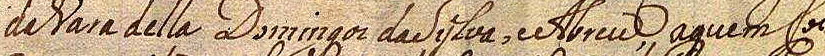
da Vara della Domingoz da SyLva, e Abreu, a quem foi
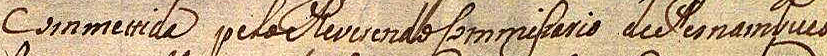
commettida pelo Reverendo Commissario de Pernambuco
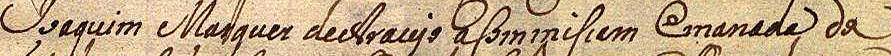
Ioaquim Marquez de Araujo a Commissam emanada do
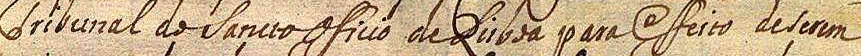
Tribunal do Sancto officio de Lisboa para effeito de serem
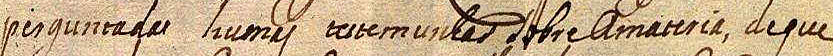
perguntadas humas testemunhas sobre a materia, de que
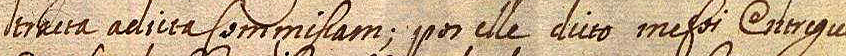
tracta a dicta Commissam; por elle dicto me foi entregue
